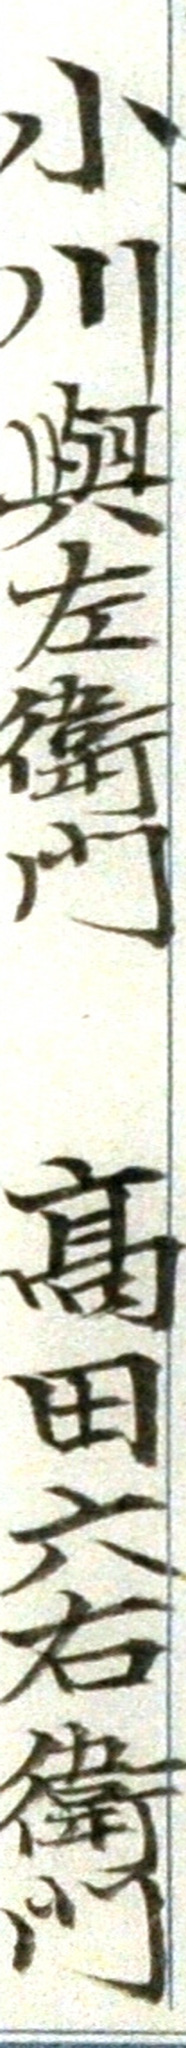小川与左衛門髙田六右衛門

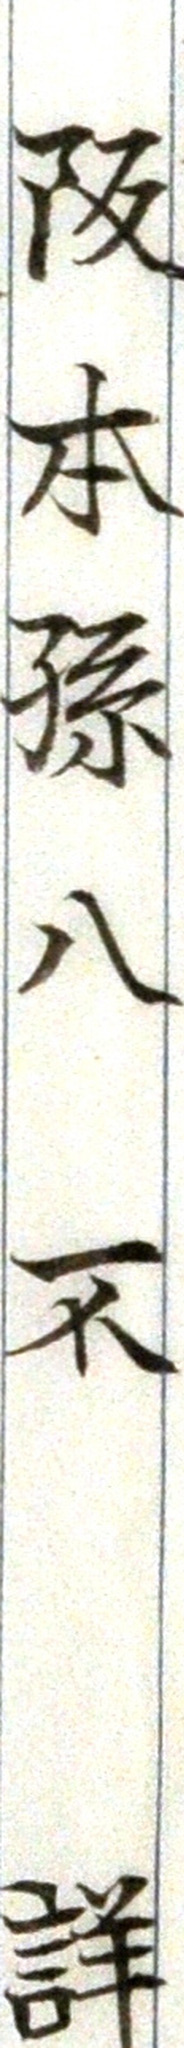阪本孫八不詳
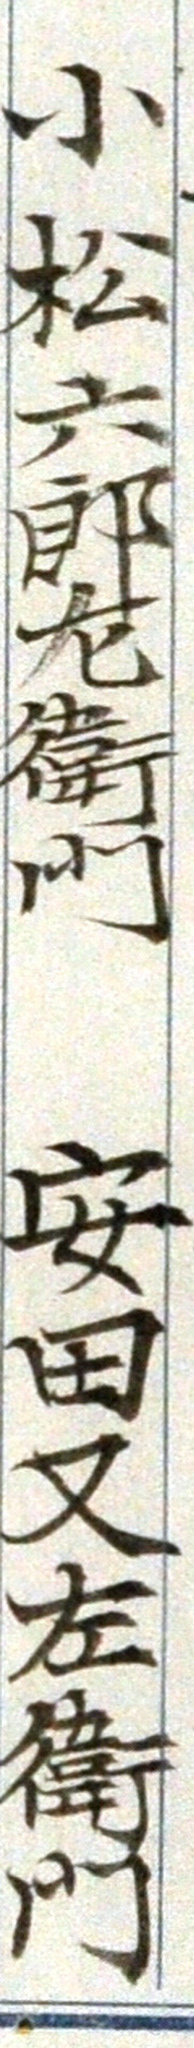小松六郎左衛門安田又左衛門
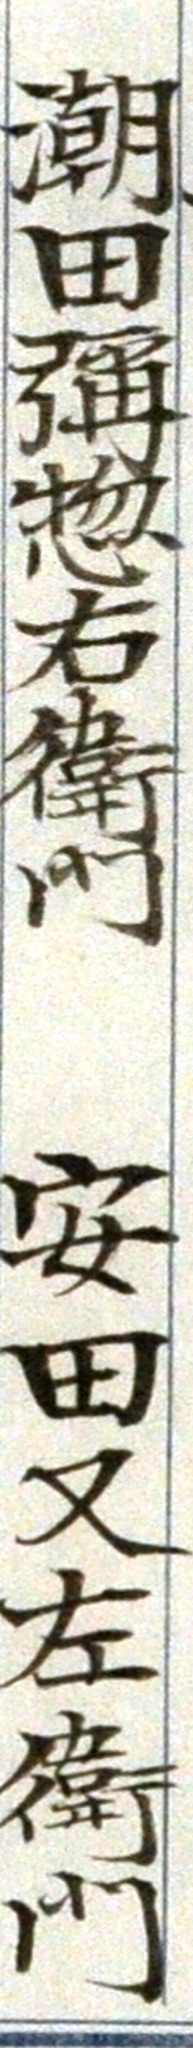潮田弥惣右衛門安田又左衛門
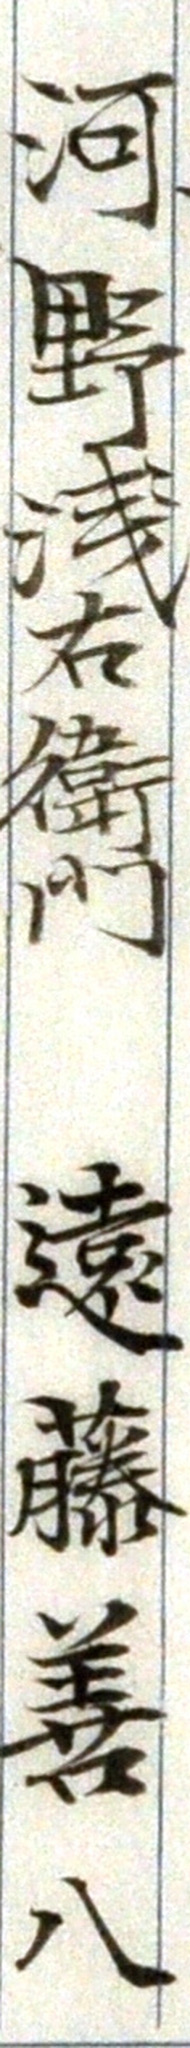河野浅右衛門遠藤善八
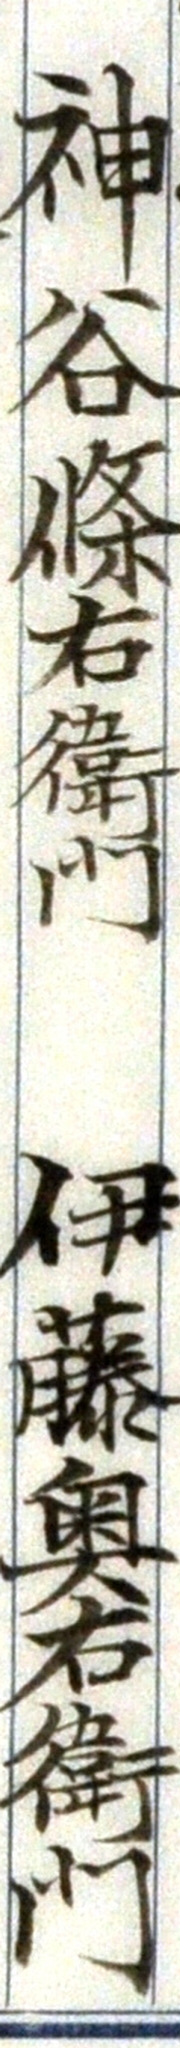神谷条右衛門伊藤奥右衛門
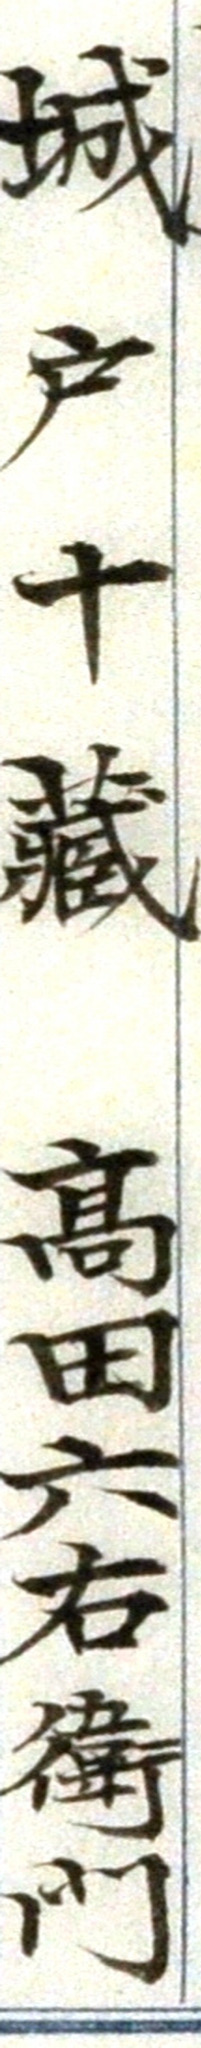城戸十蔵髙田六右衛門
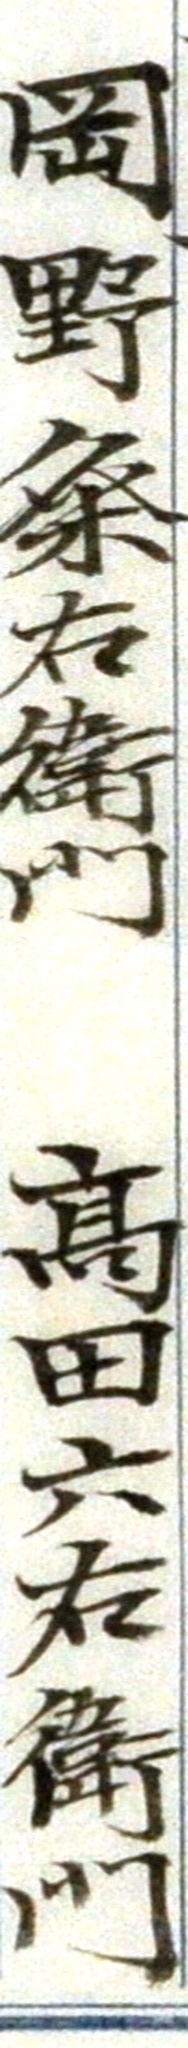岡野粂右衛門髙田六右衛門
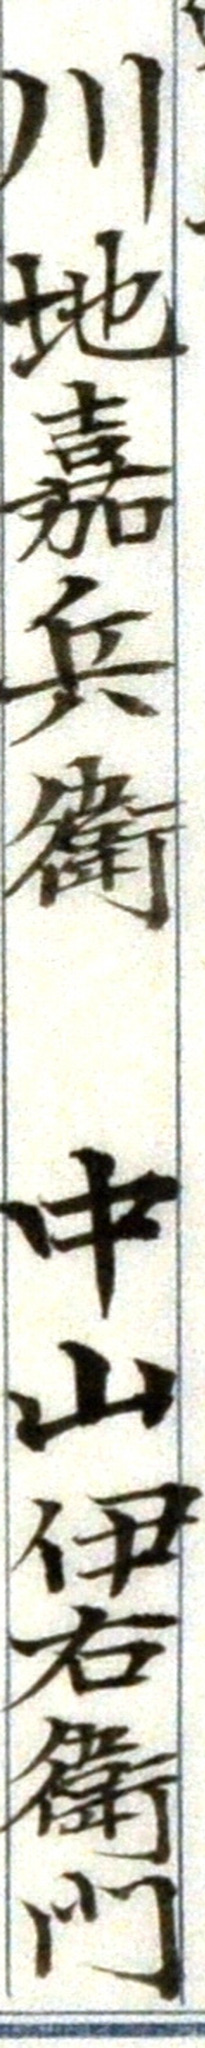川地嘉兵衛中山伊右衛門
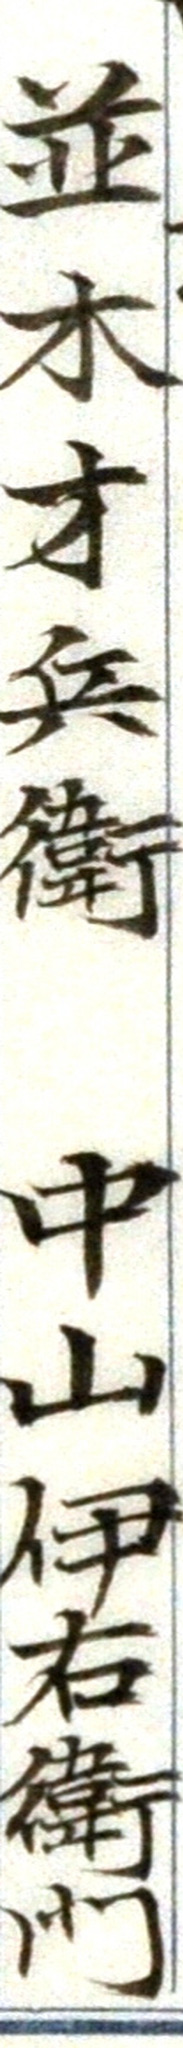並木才兵衛中山伊右衛門
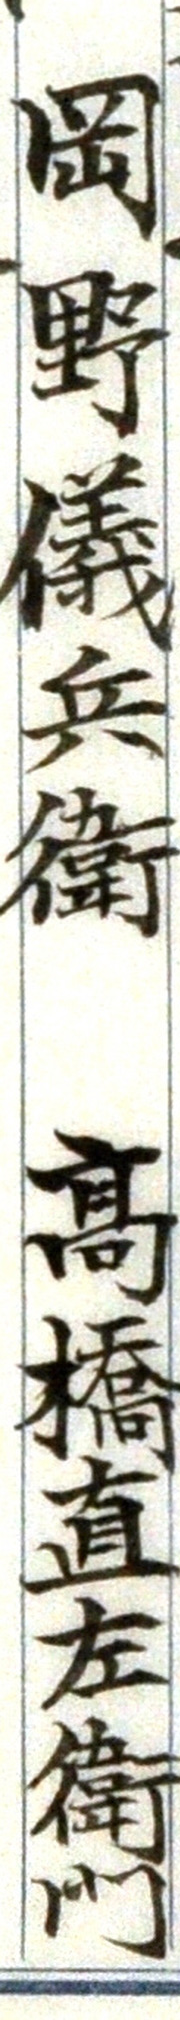岡野儀兵衛髙橋直左衛門

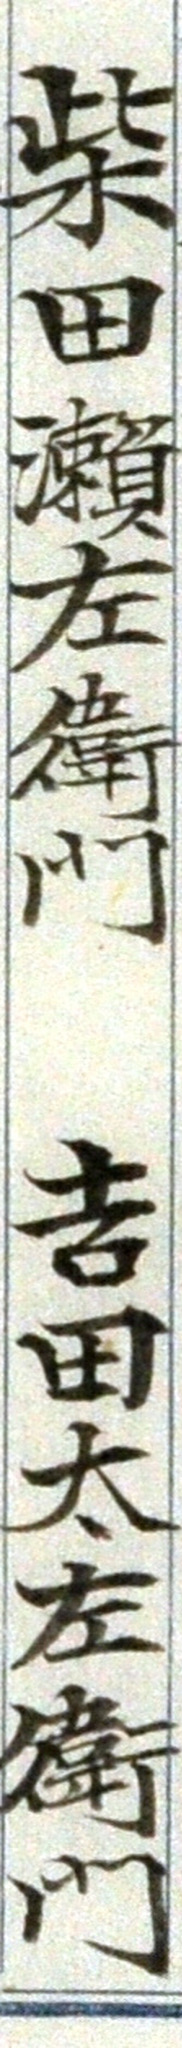柴田瀬左衛門吉田太左衛門
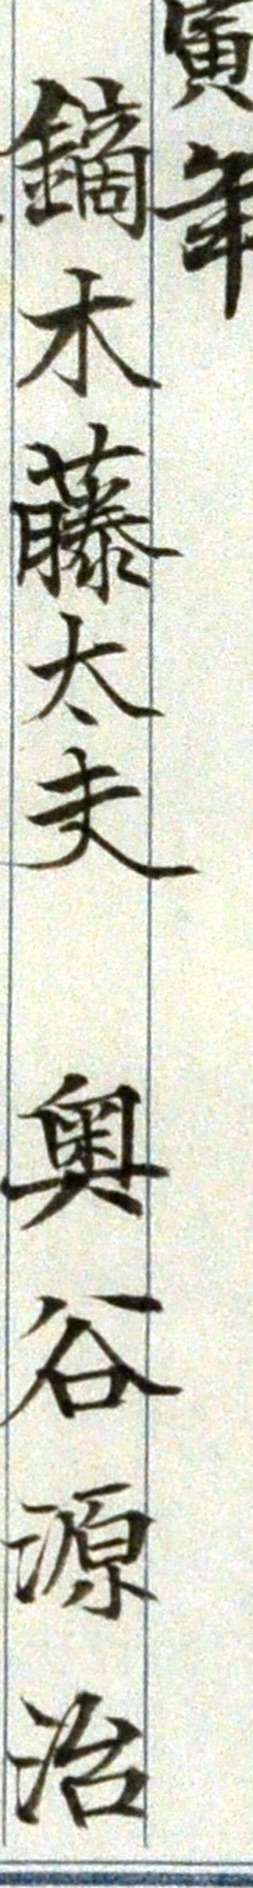鏑木藤太夫奥谷源治
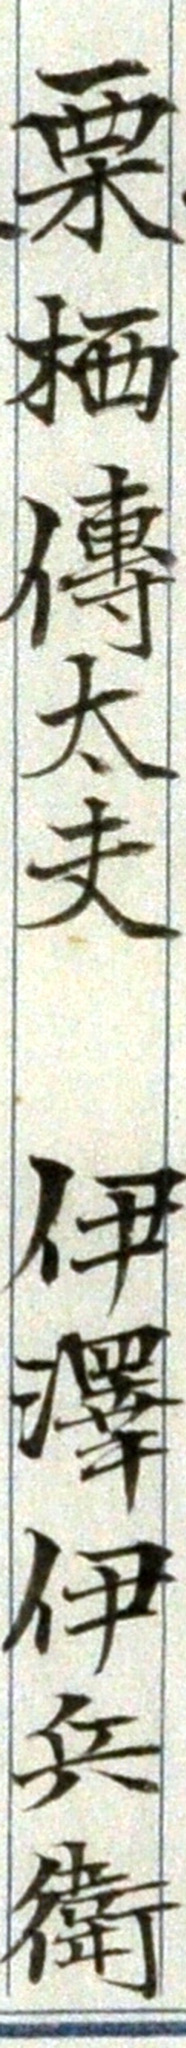来栖伝太夫伊澤伊兵衛
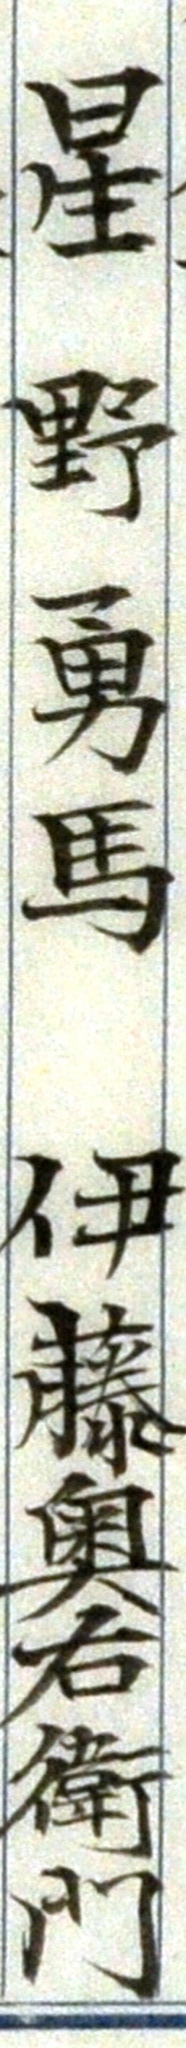星野勇馬伊藤奥右衛門
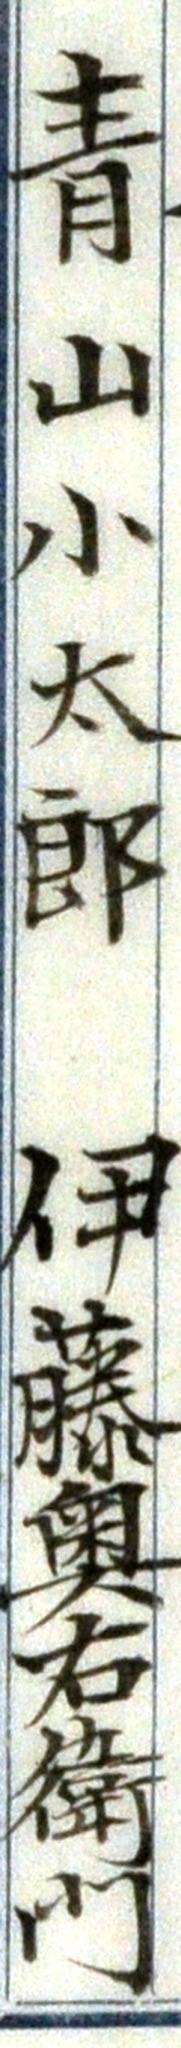青山小太郎伊藤奥右衛門
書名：諏訪御柱祭之節・騎馬大将御中間頭・御柱引人足
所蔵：伊那市立高遠町図書館・合同会社AMANE
